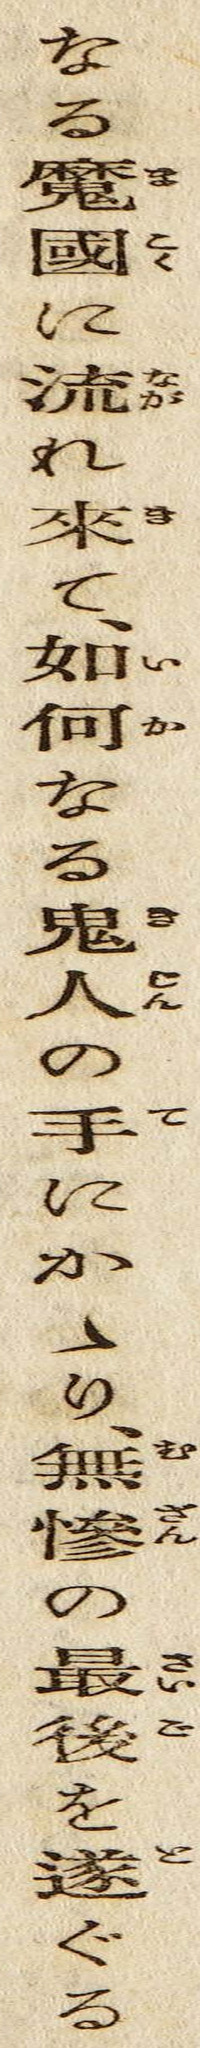なる魔国に流れ来て、如何なる鬼人の手にかゝり、無惨の最期を遂ぐる
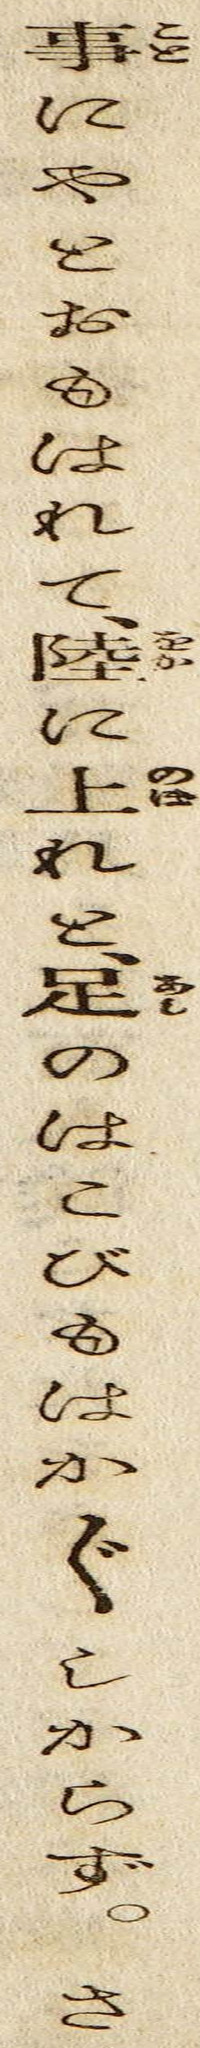事にやとおもはれて、陸に上れと、足のはこびもはか〴〵しからず。さ
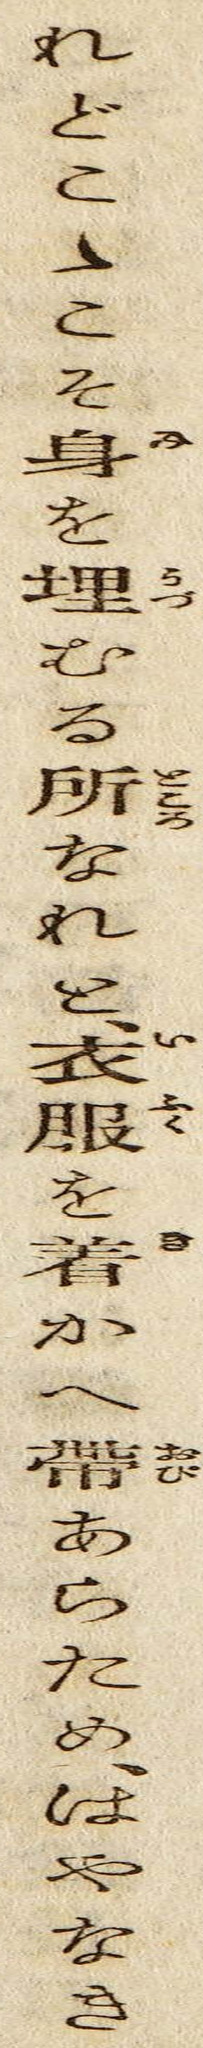れどこゝこそ身を埋むる所なれと、衣服を着かへ帯あらため、はやなき
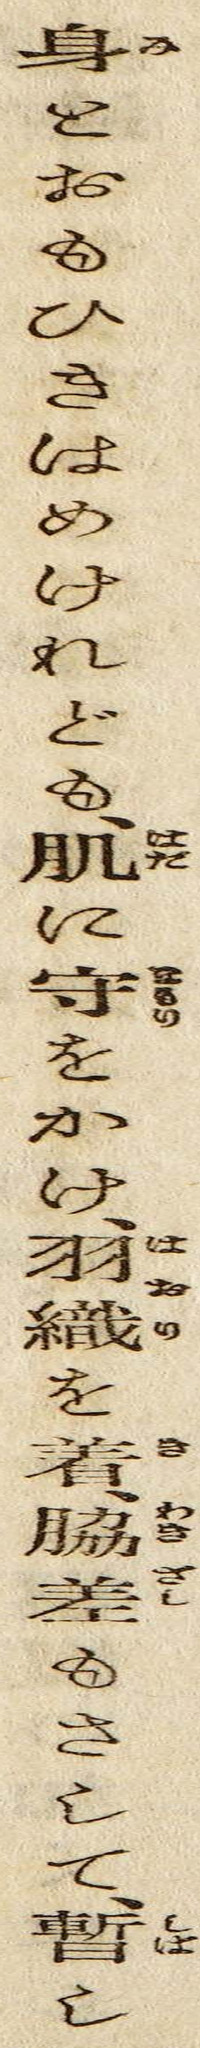身とおもひきはめけれども、肌に守をかけ、羽織を着、脇差もさして、暫し

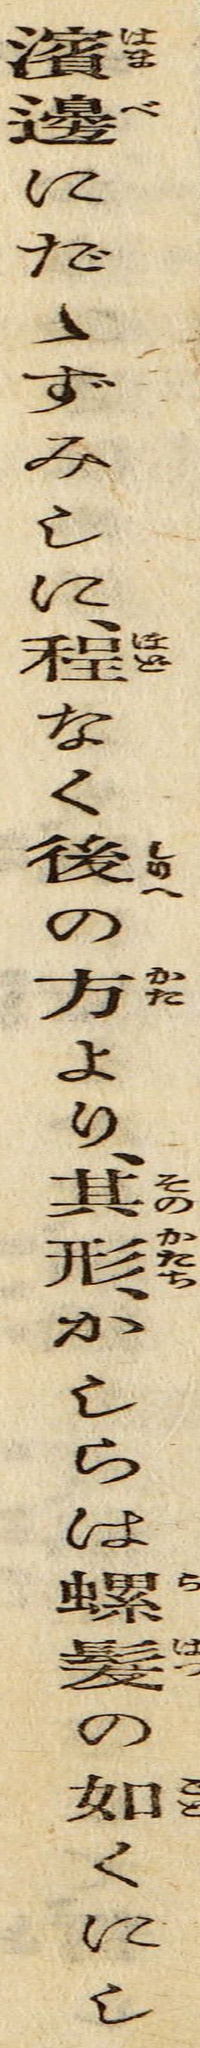浜辺にだゝずみしに、程なく後の方より、其形、かしらは螺髪の如くにし
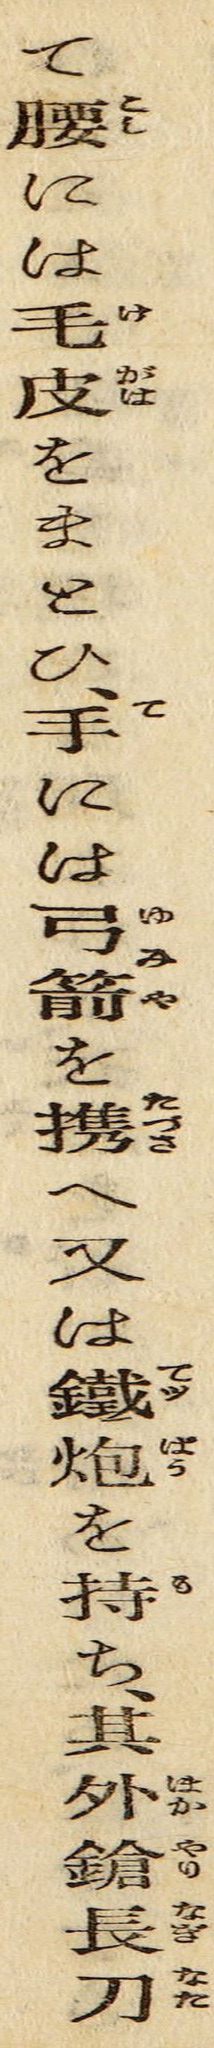て腰には毛皮をまとひ、手には弓箭を携へ又は鉄炮を持ち、其外鎗長刀
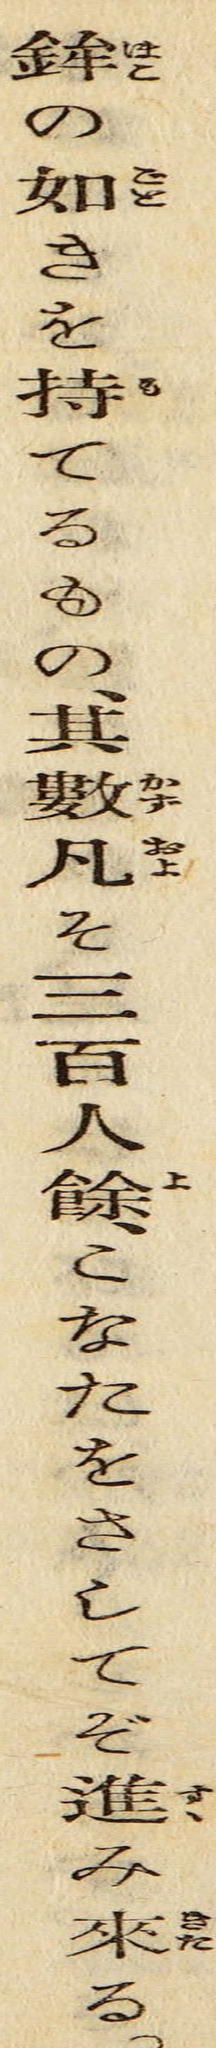鉾の如きを持てるもの、其数凡そ三百人余、こなたをさしてぞ進み来る。
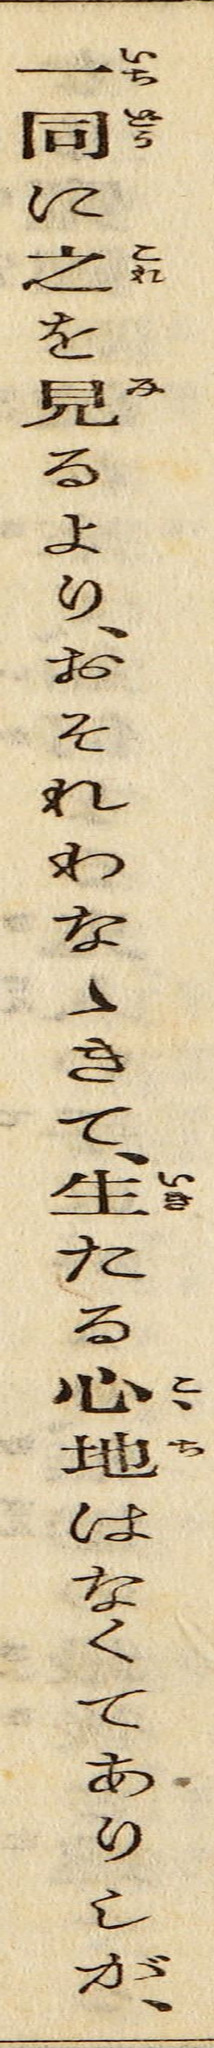一同に之を見るより、おそれわなゝきて、生たる心地はなくてありしが、
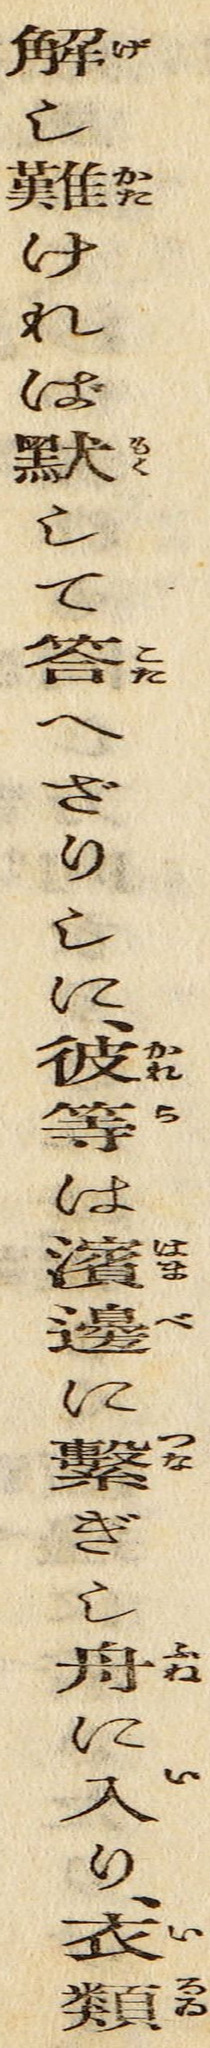解し難ければ黙して答へざりしに、彼等は浜辺に繋ぎし舟に入り、衣類
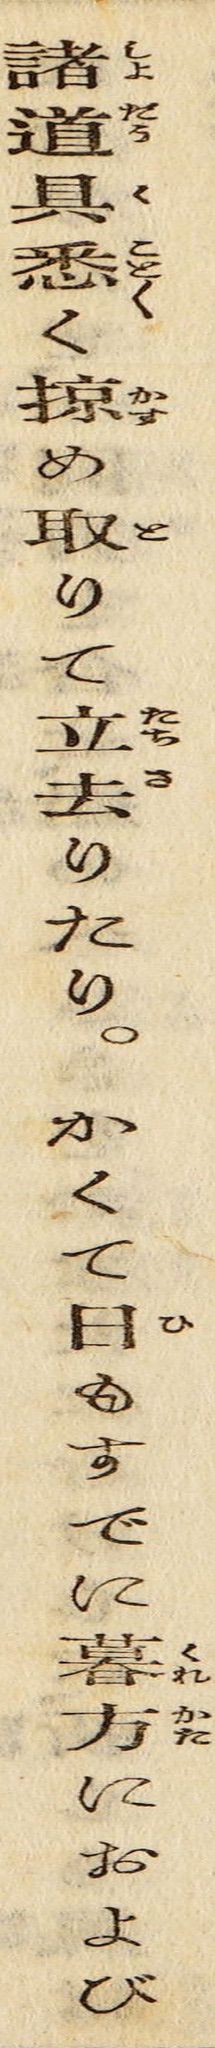諸道具悉く掠め取りて立去りたり。かくて日もすでに暮方におよび
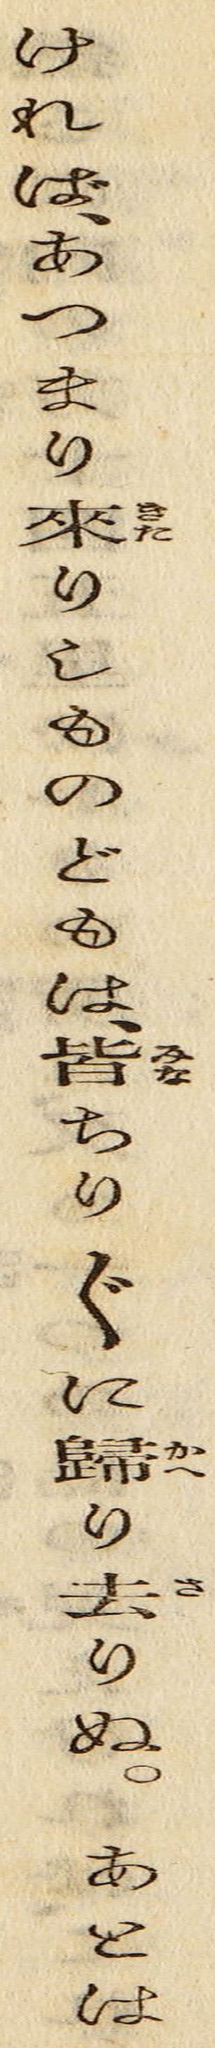ければ、あつまり来りしものどもは、皆ちり〴〵に帰り去りぬ。あとは
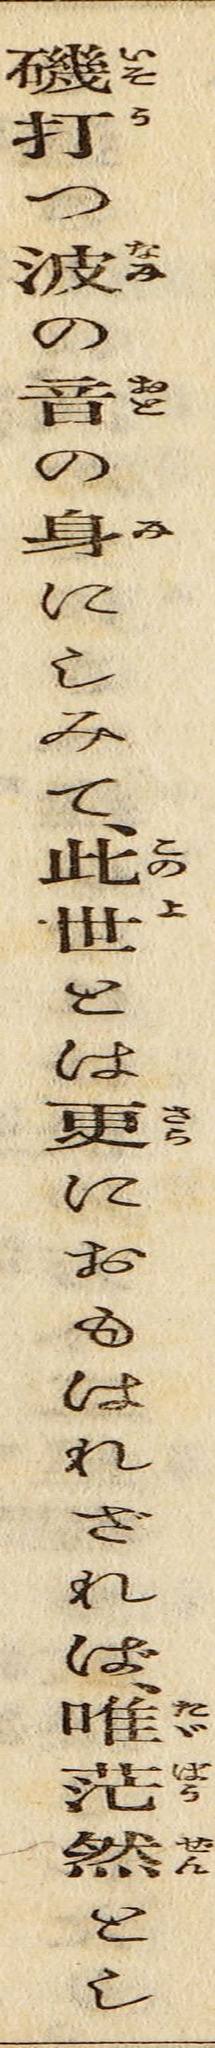磯打つ波の音の身にしみて、此世とは更におもはれざれば、唯茫然とし
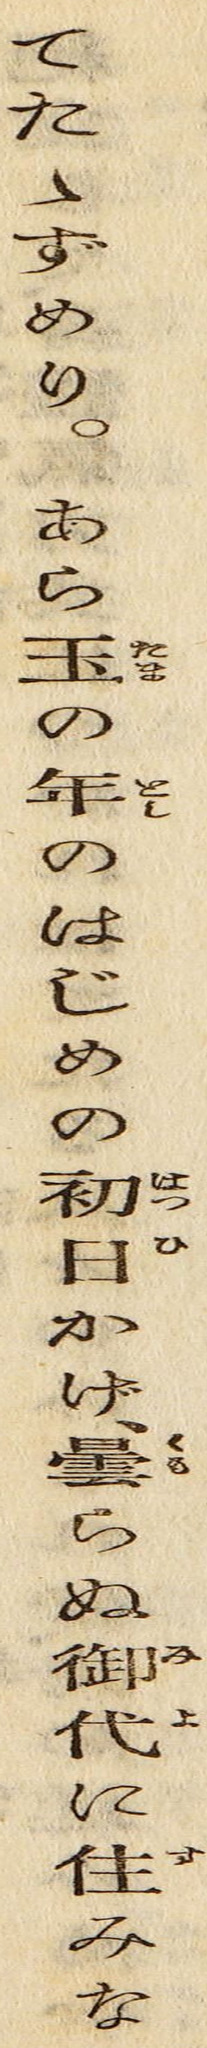てたゝずめり。あら玉の年のはじめの初日かげ、曇らぬ御代に住みな
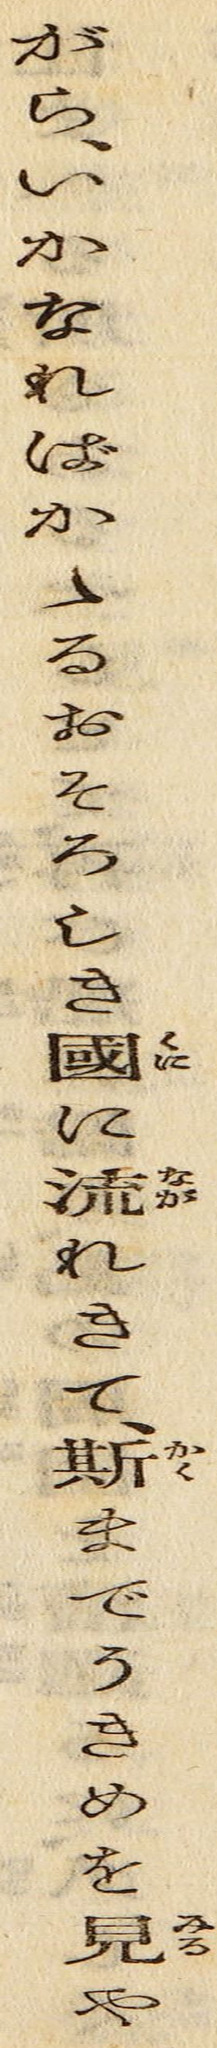がら、いかなればかゝるおそろしき国に流れきて、斯までうきめを見や
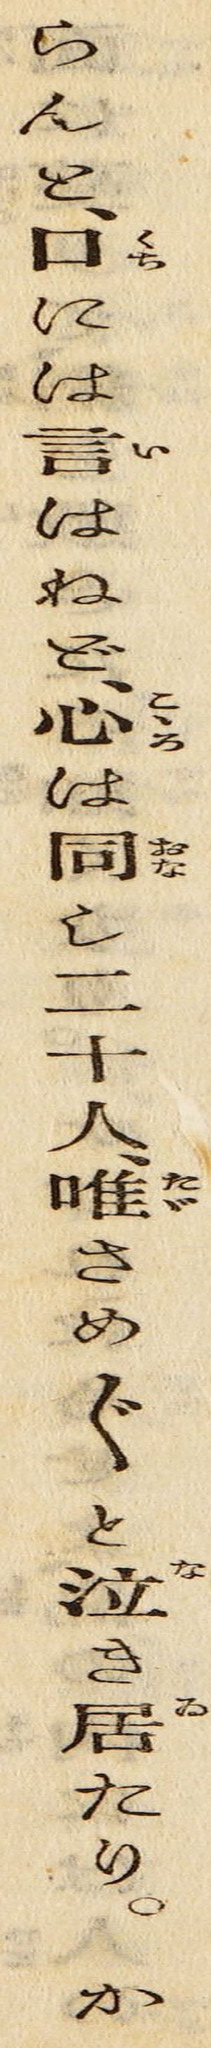らんと、口には言はねど、心は同し二十人、唯さめ〴〵と泣き居たり。か

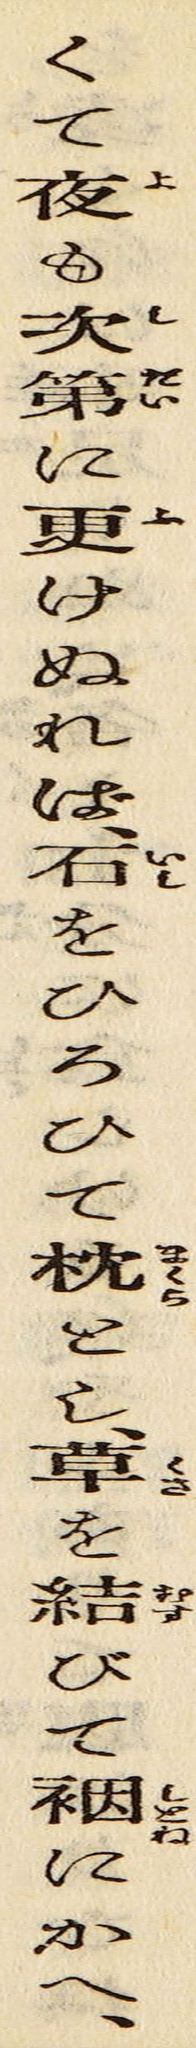くて夜も次第に更けぬれば、石をひろひて枕とし、草を結びて裀にかへ、
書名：日本漂流譚
